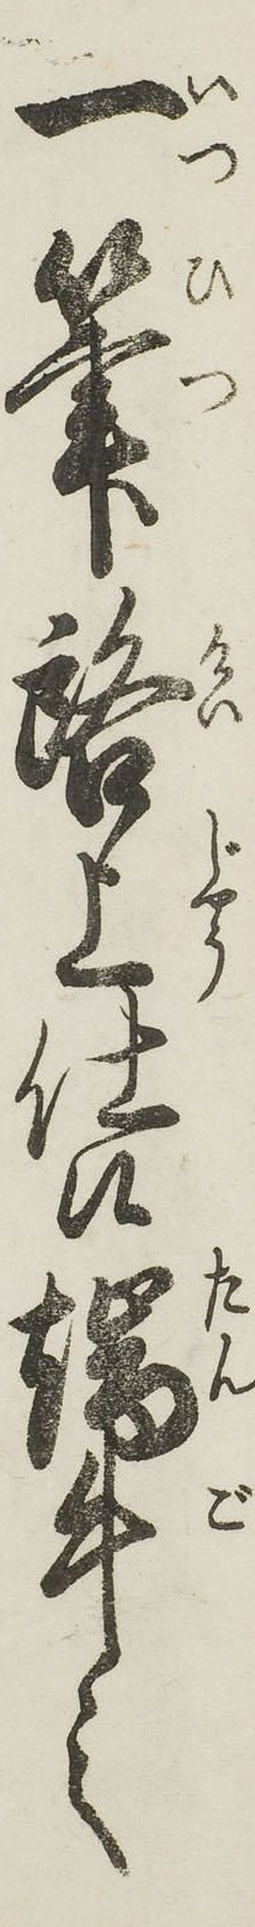一筆啓上仕候端午之
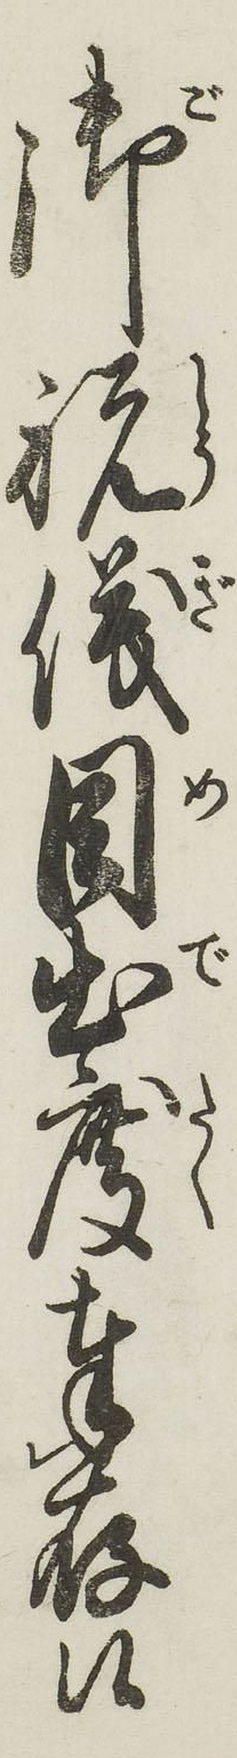御祝儀目出度奉存候
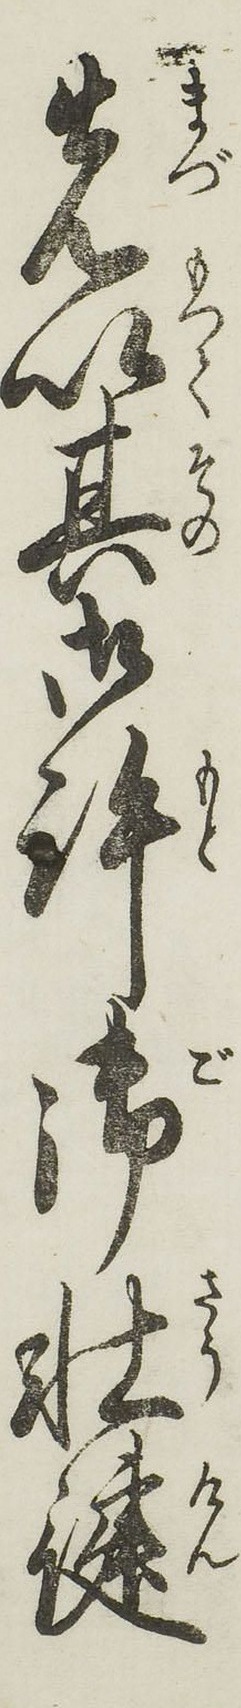先以其御許御壮健
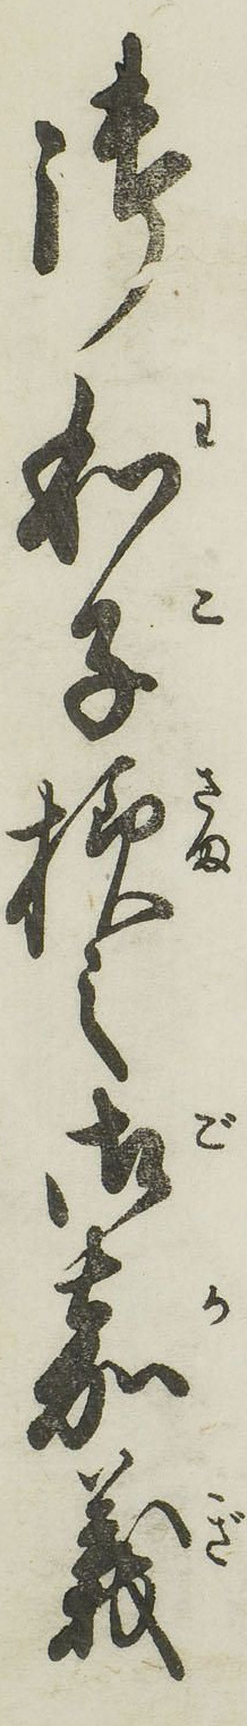御和子様之御嘉義

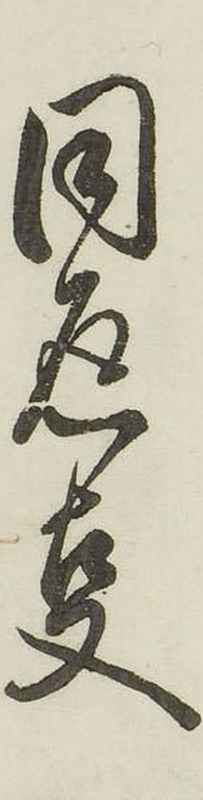同返事

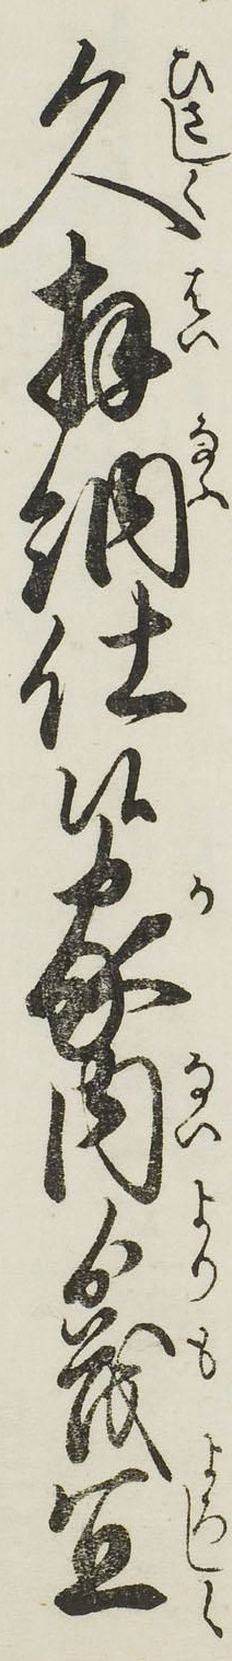久拝納仕候家内ゟ茂宜

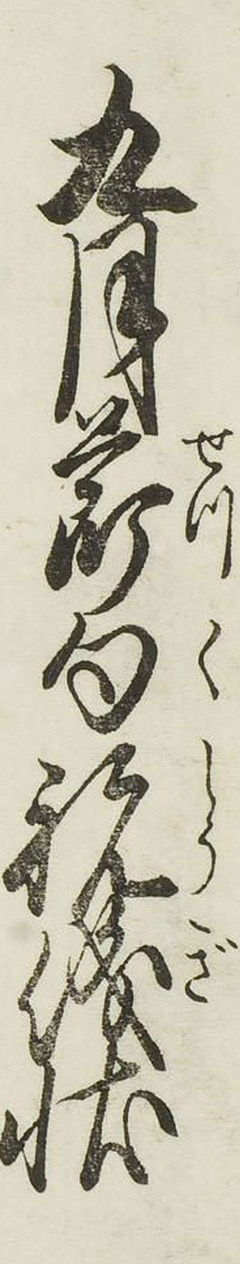九月節句祝儀状
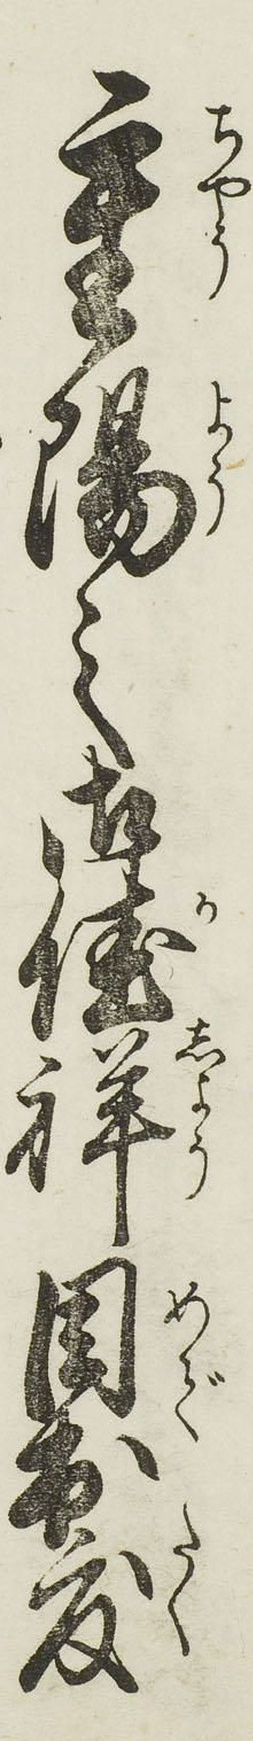重陽之御佳祥目出度
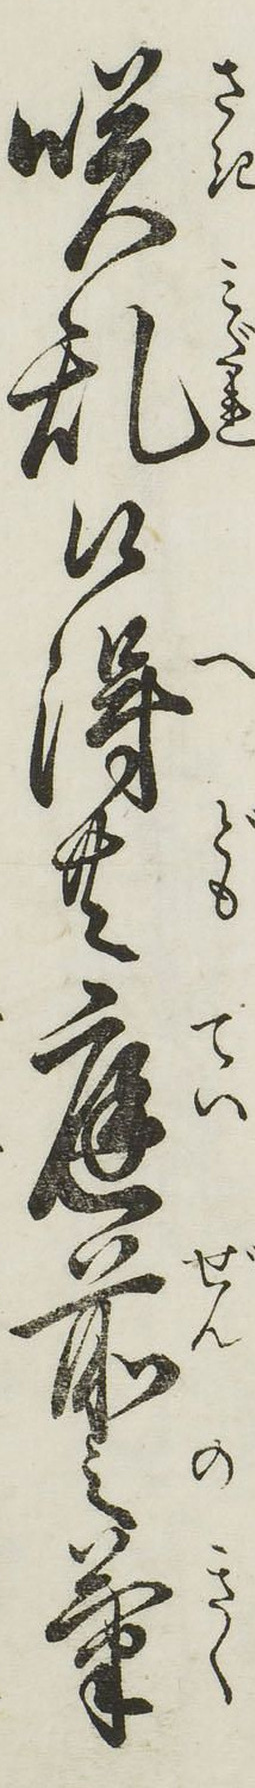咲乱候得共庭前之菊
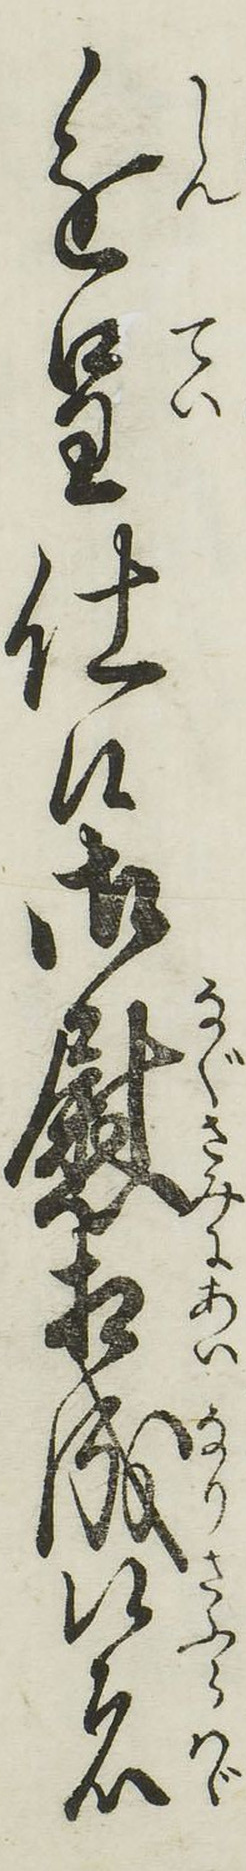進呈仕候御慰相成候者

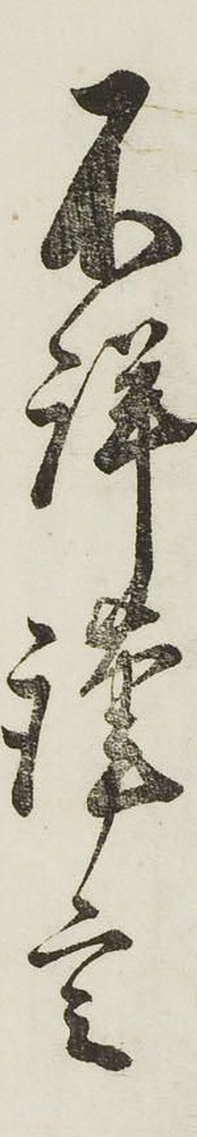不詳謹言
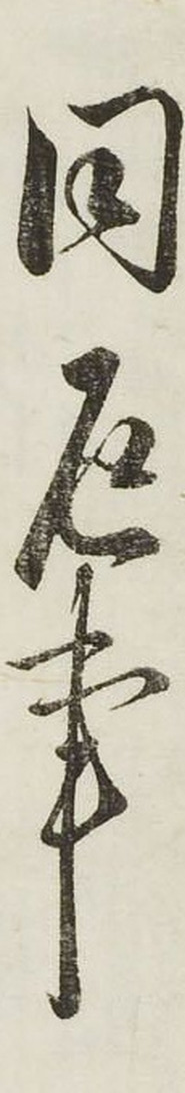同返事
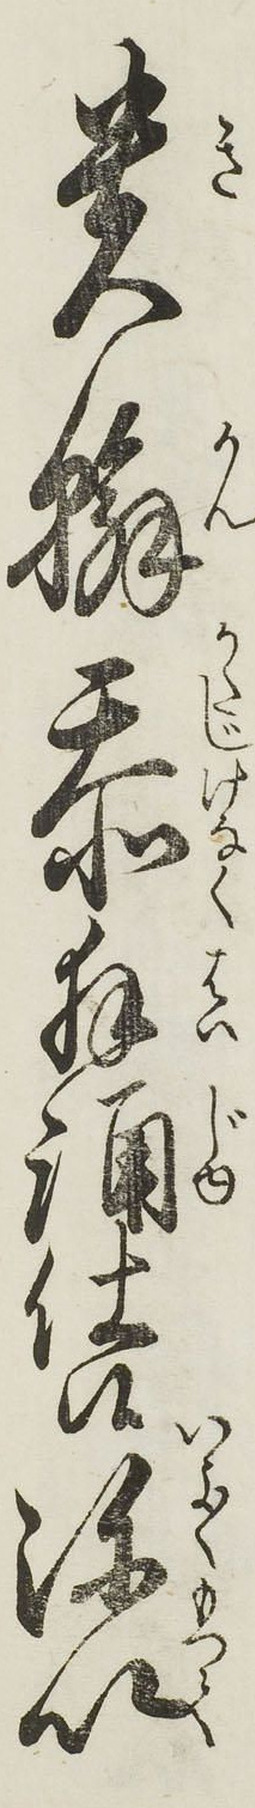貴翰忝拝誦仕候弥以
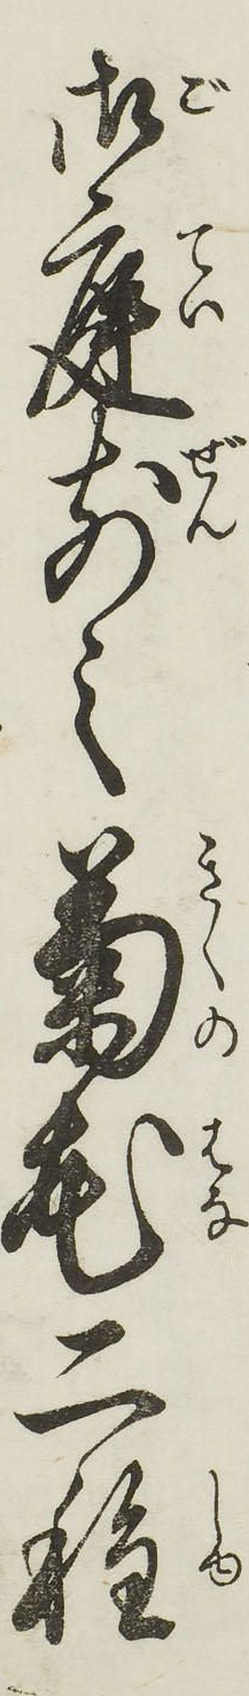御庭前之菊花二種

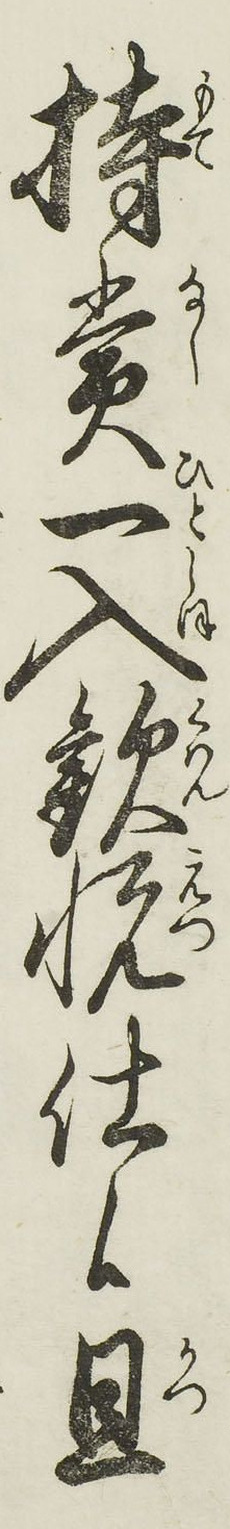持賞一入歓悦仕候且
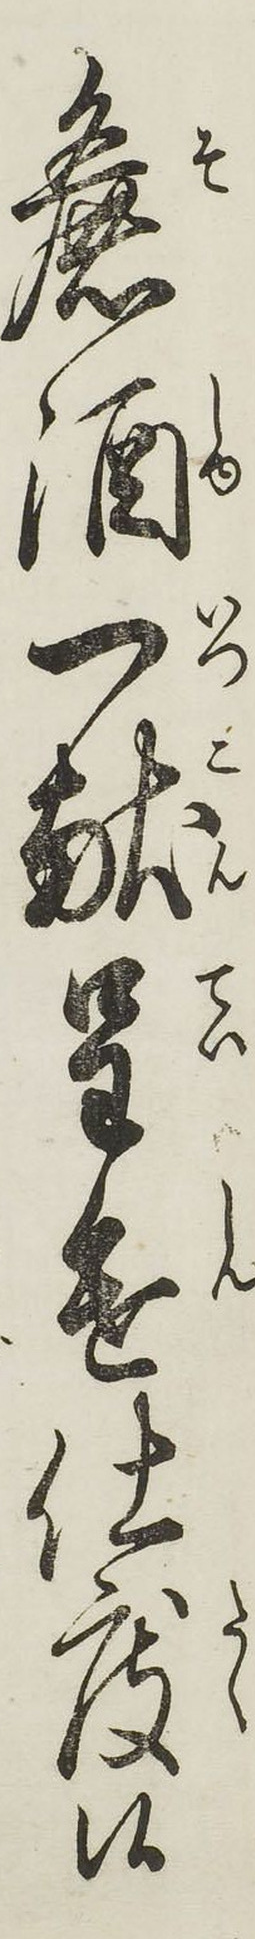麤酒一献呈進仕度候
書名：商人書翰便覧
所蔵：東京学芸大学教育コンテンツアーカイブ
